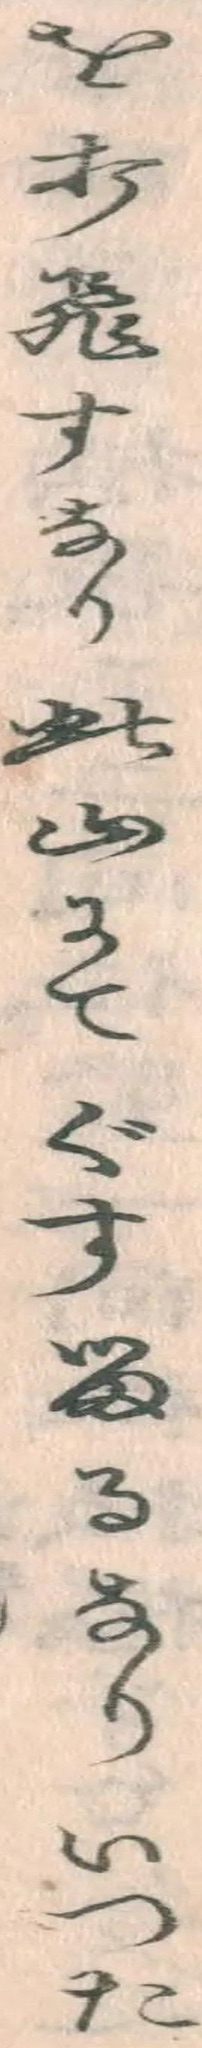を打飛すなり此山にてぐす留るなりいつた
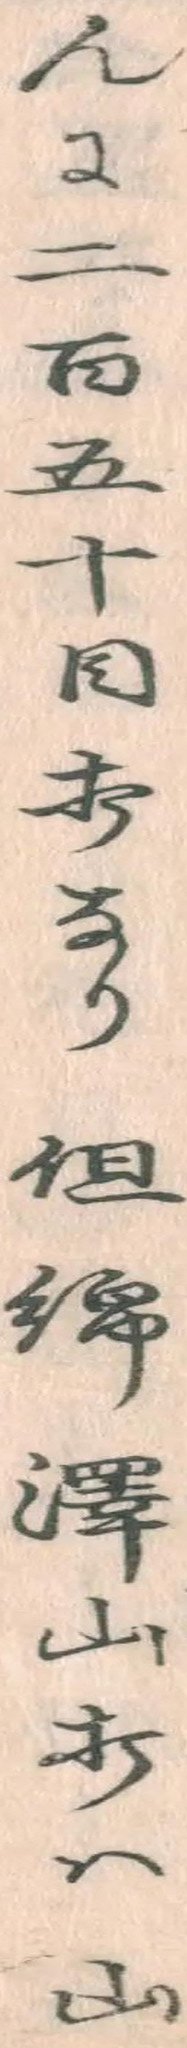んに二百五十目打なり但綿沢山打は山
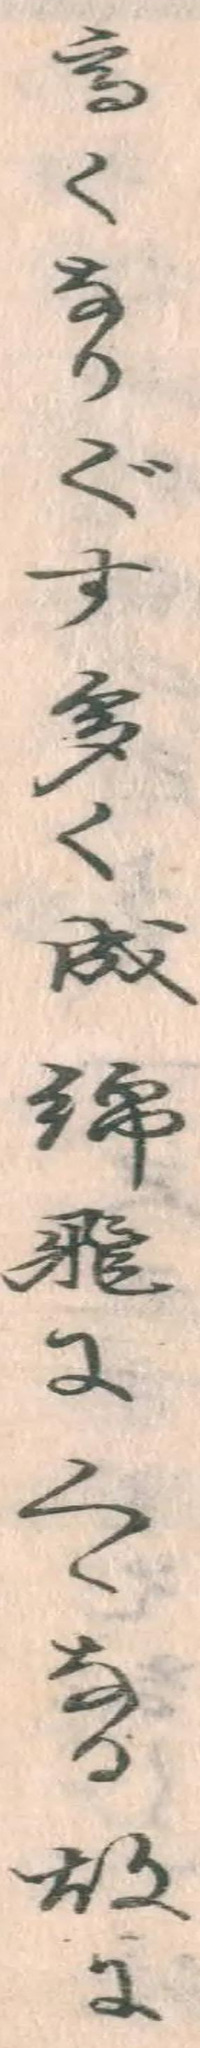高くなりぐす多く成綿飛にくゝなる故に
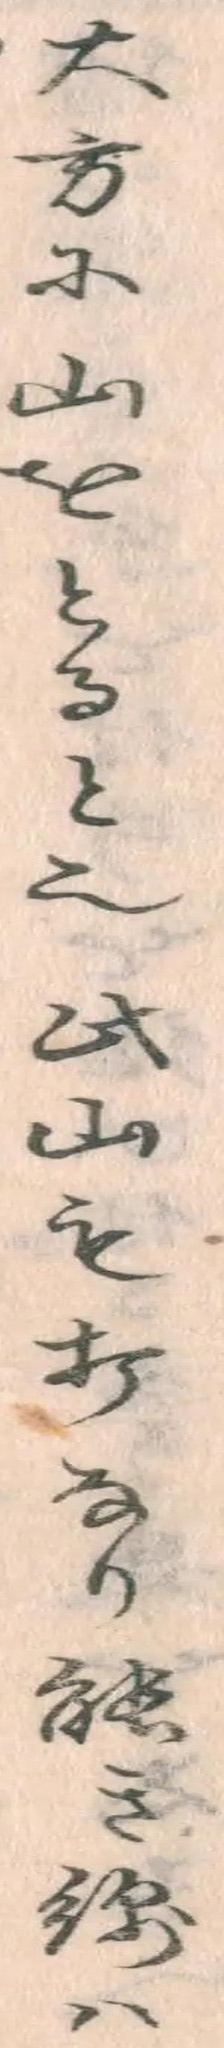大方に山をとると也此山も打なり能き綿は
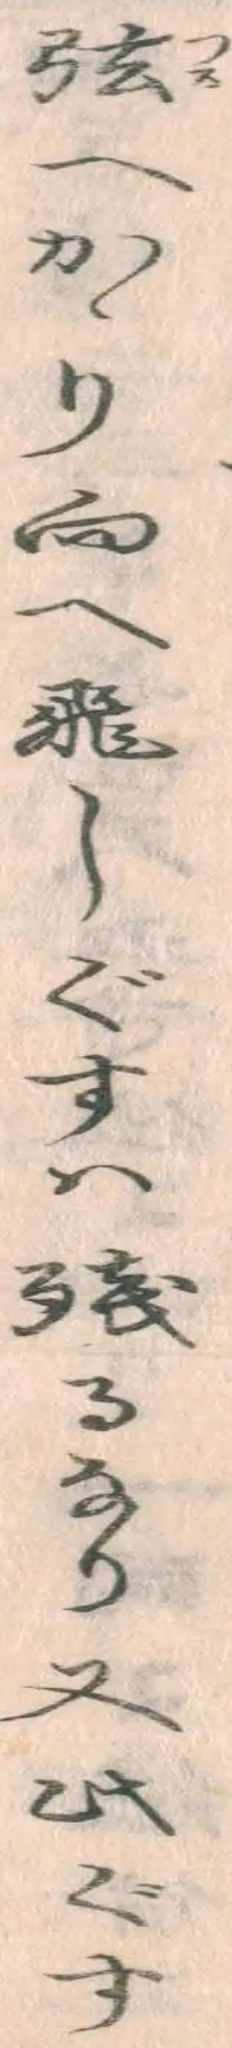弦へかゝり向へ飛しぐすは残るなり又此ぐす
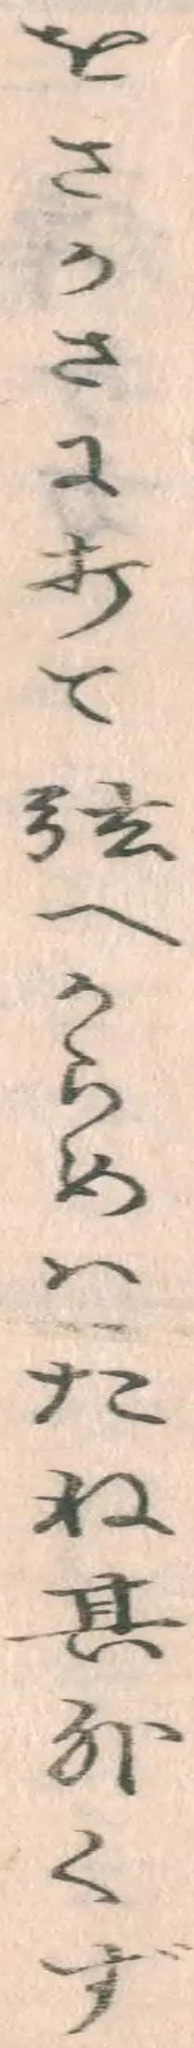をさかさに打て弦へからめはたね其外くず
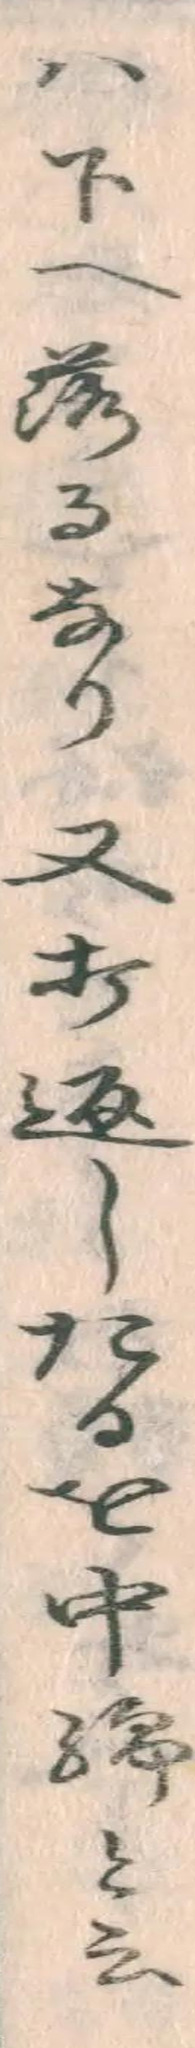は下へ落るなり又打返したるを中綿と云
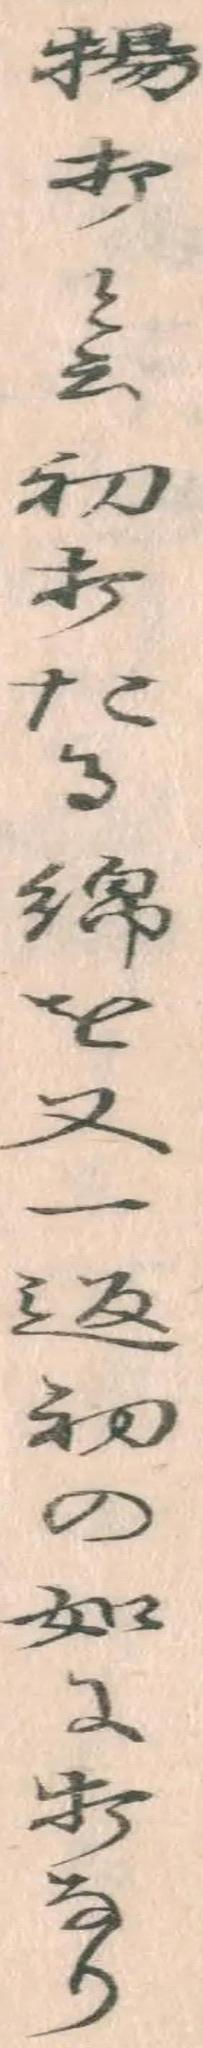一揚打と云初打たる綿を又一返初の如に打なり
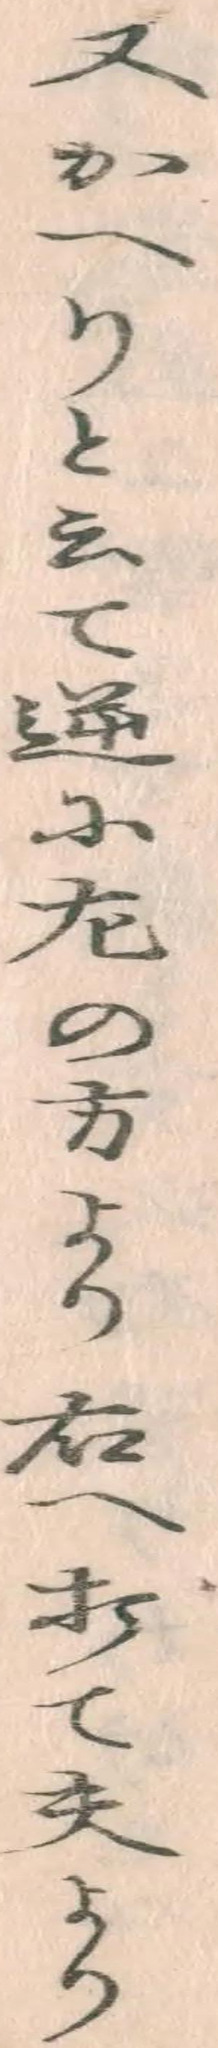又かへりと云て逆に左の方より右へ打て夫より
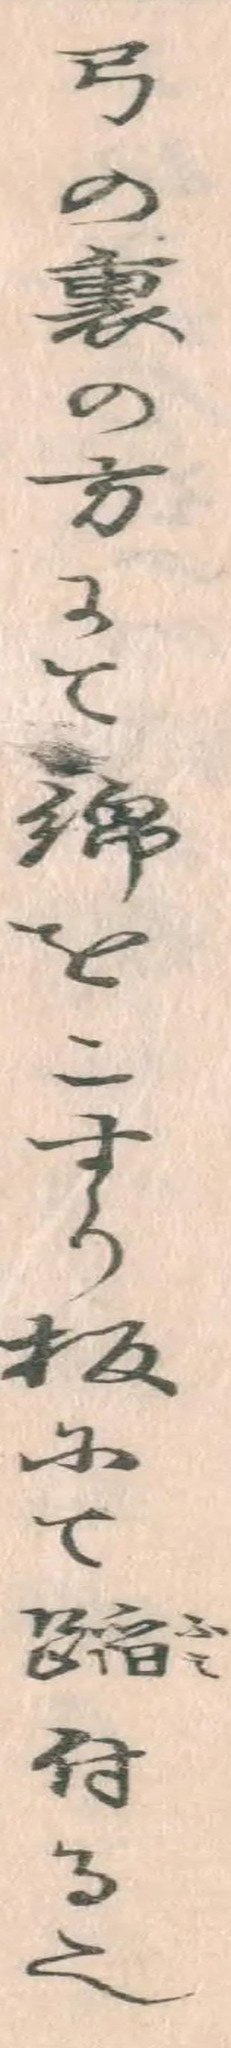弓の裏の方にて綿をこすり板にて蹈付る也
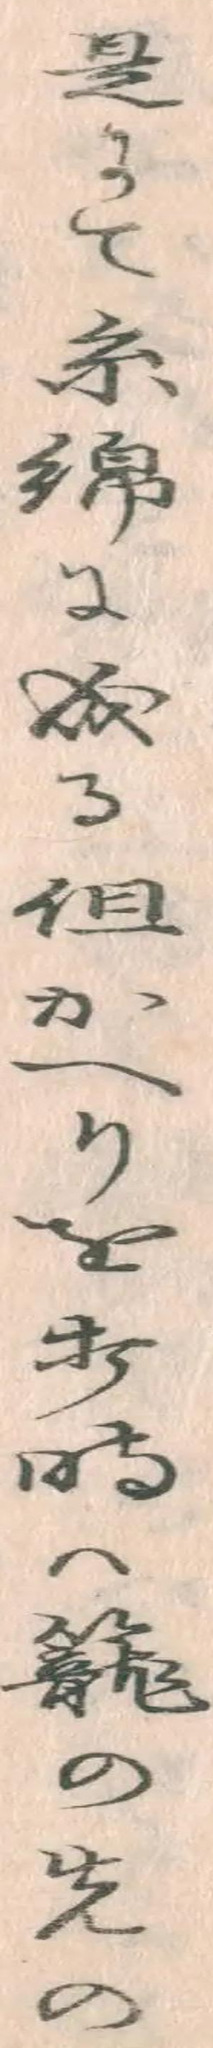是にて糸綿に成る但かへりを打時は籠の先の
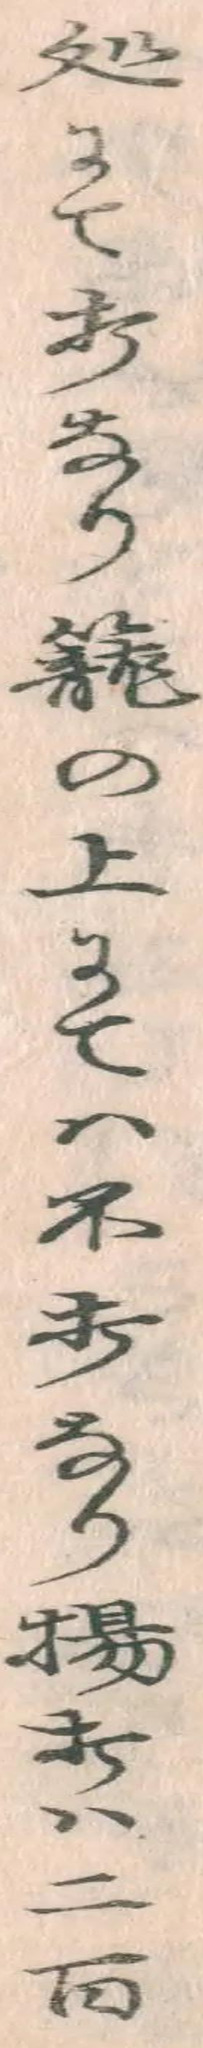処にて打なり籠の上にては不打なり揚打は二百
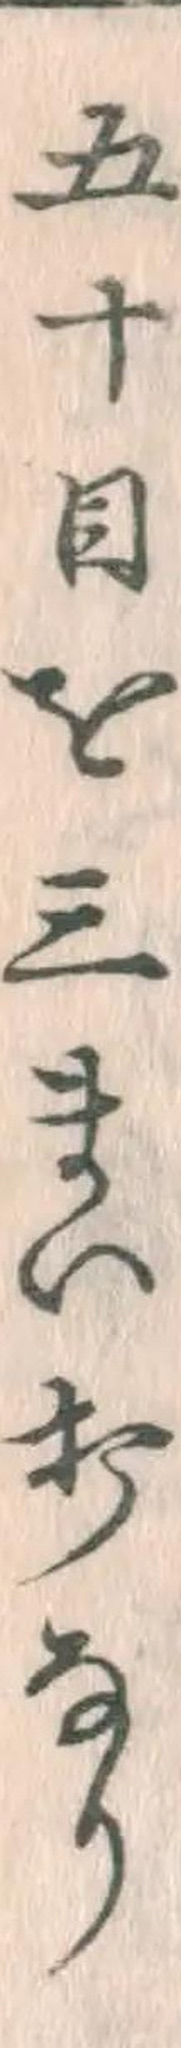五十目を三まい打なり
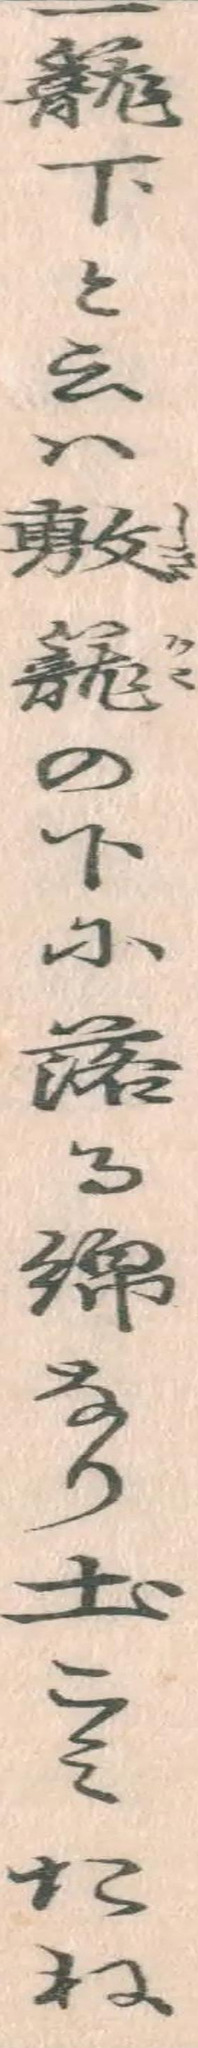一籠下と云は敷籠の下に落る綿なり土こみたね
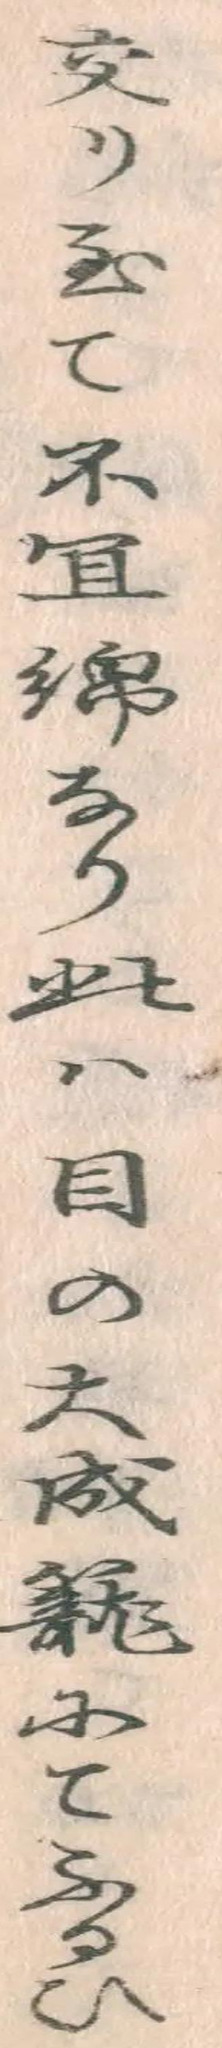交り至て不宜綿なり此は目の大成籠にてふるひ
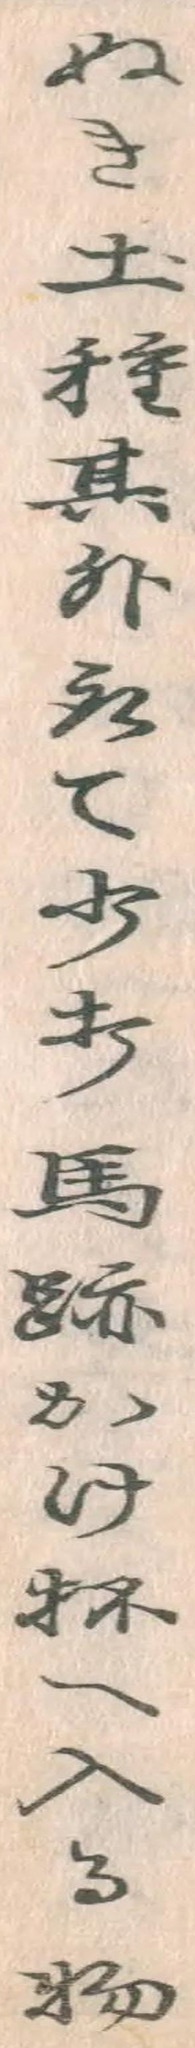ぬき土種其外取て少打馬跡かけ抔へ入る物
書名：機織彙編 5巻. [1]
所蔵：国立国会図書館 National Diet Library, JAPAN
